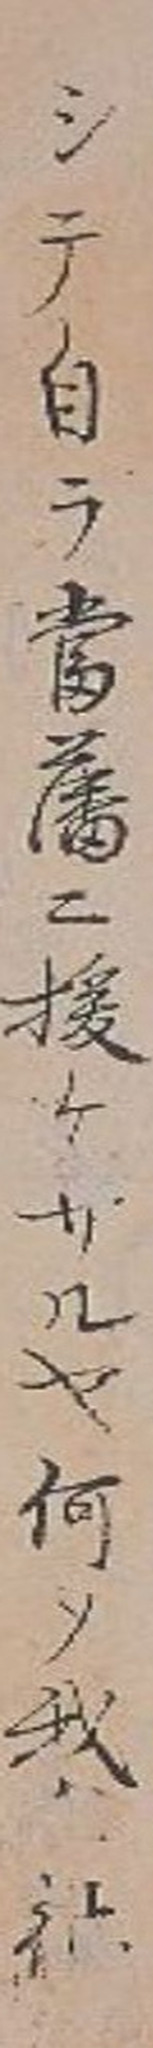シテ自ラ当藩ニ援ケサルヤ何ソ我
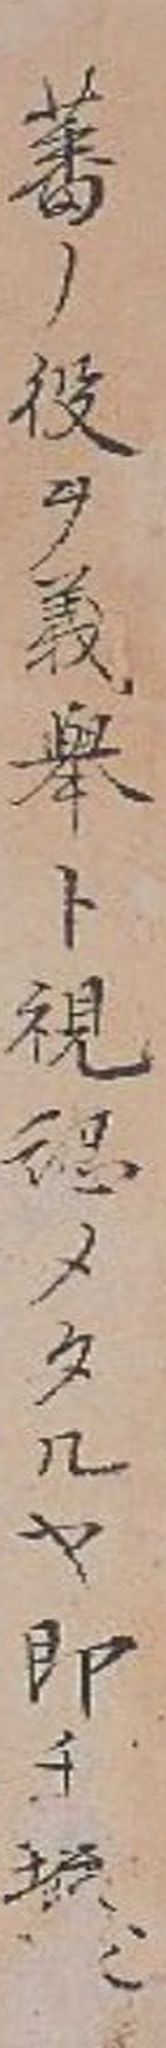蕃ノ役ヲ義挙ト視認メタルヤ即チ琉
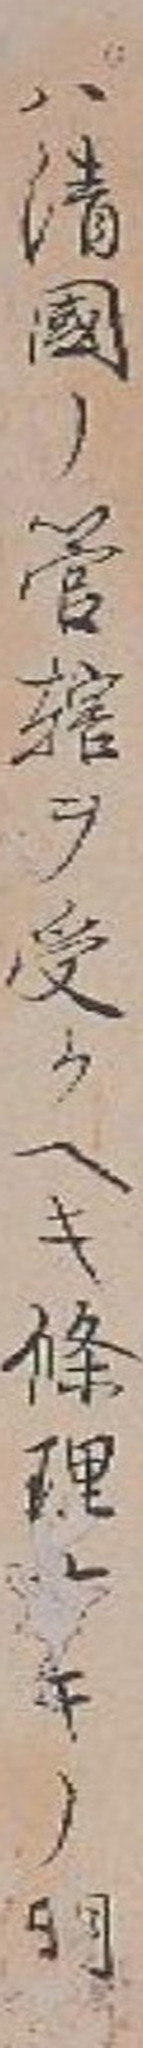ハ清国ノ管轄ヲ受クヘキ条理ナキノ明
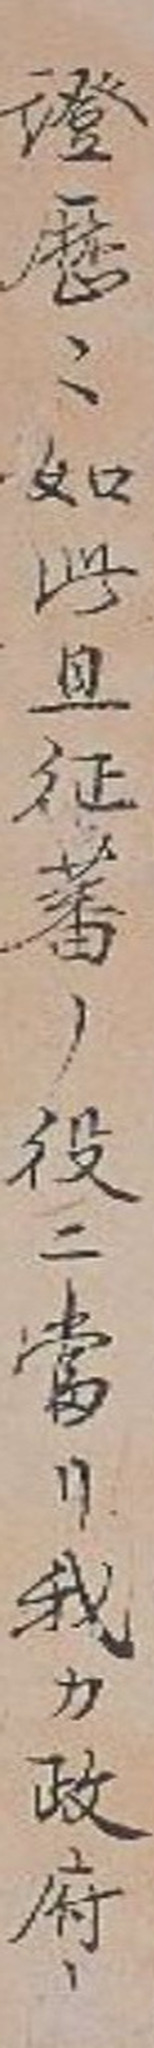証暦々如此且征蕃ノ役ニ当リ我カ政府ノ
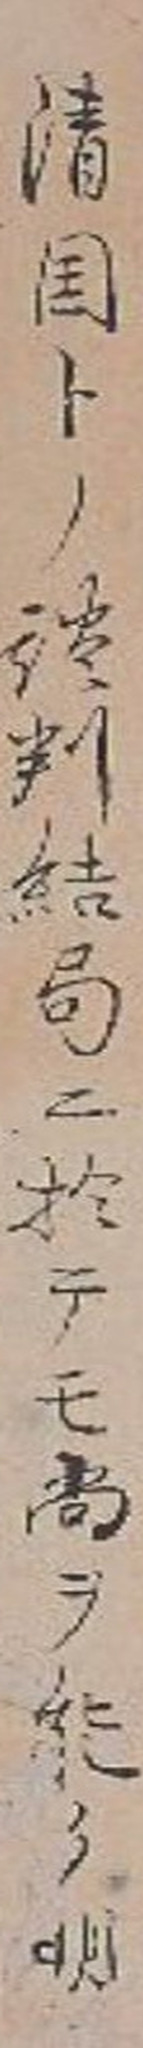清国トノ談判結局ニ於テモ尚ヲ能ク明
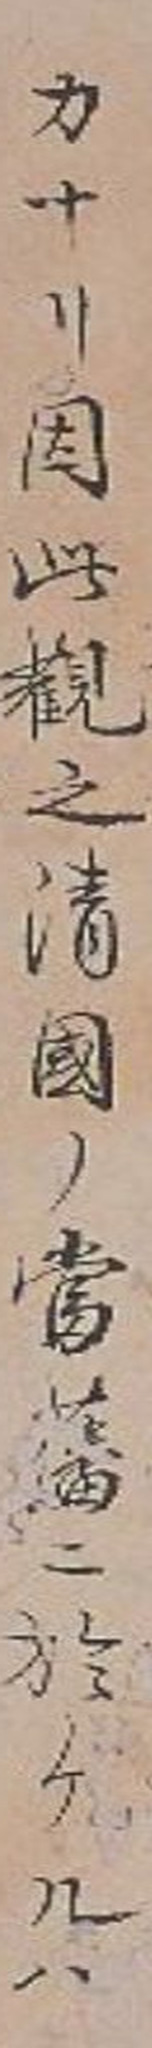カナリ因此観之清国ノ当藩ニ於ケルハ
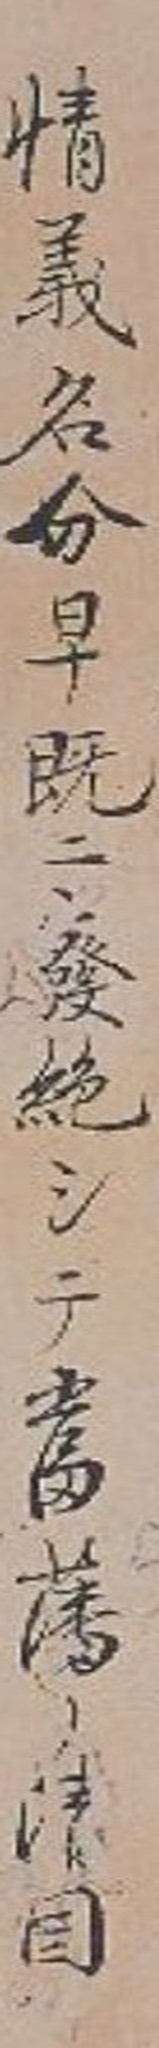情義名分早既ニ廃絶シテ当藩ノ清国
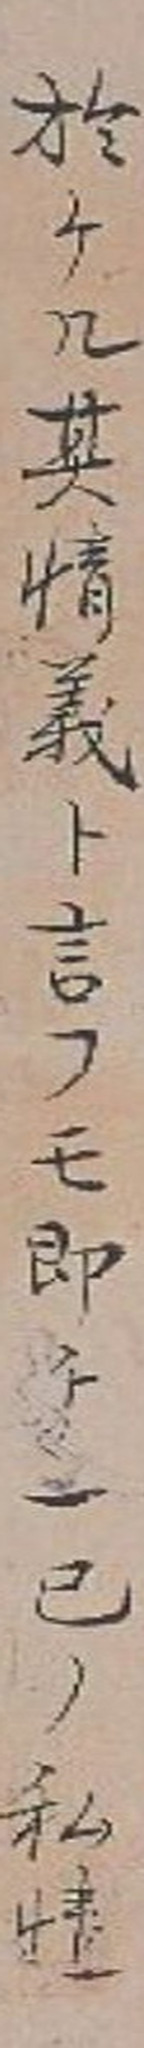於ケル其情義ト言フモ即チ一己ノ私情
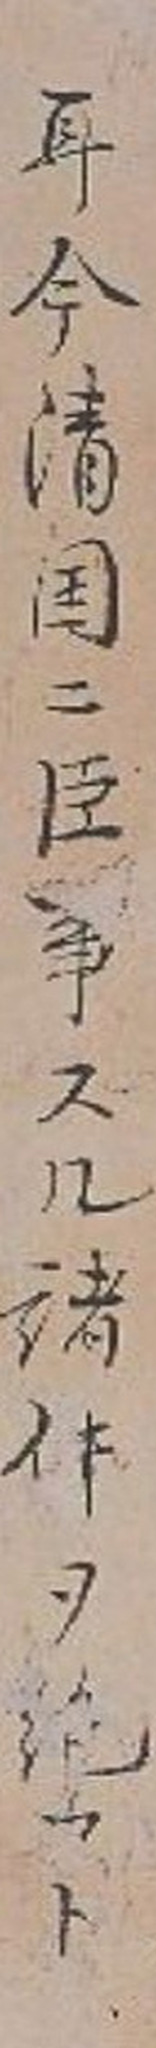耳今清国ニ臣事スル諸件ヲ絶スト

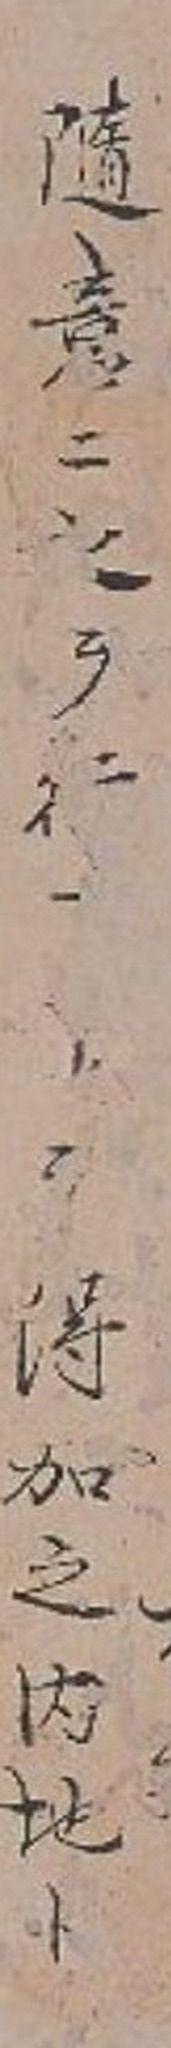随意ニ之ヲ行フコトヲ得加之内地ト
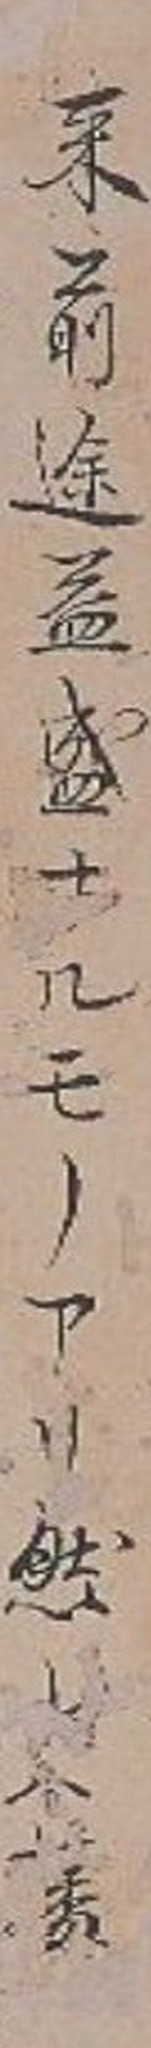来前途益盛ナルモノアリ然レハ藩
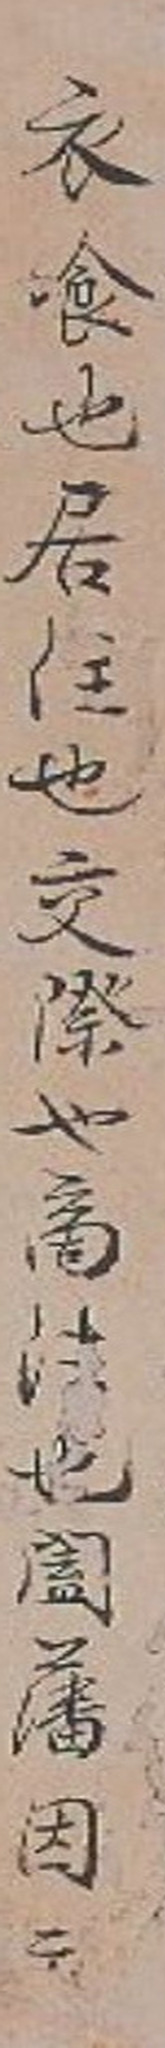衣食也居住也交際也商法也闔藩因テ
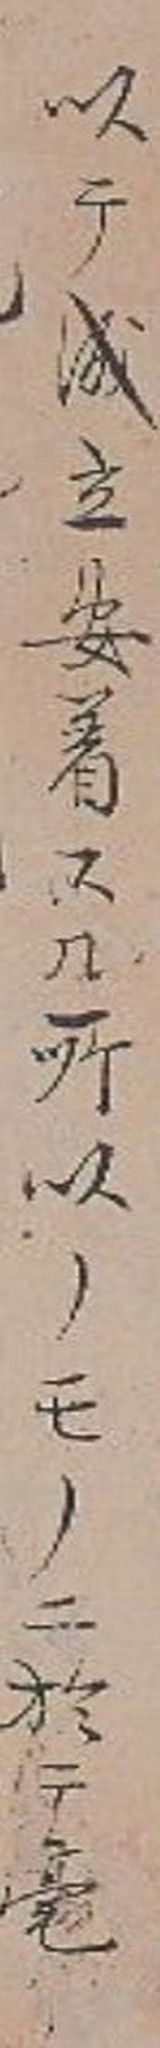以テ城立安着スル所以ノモノニ於テ毫
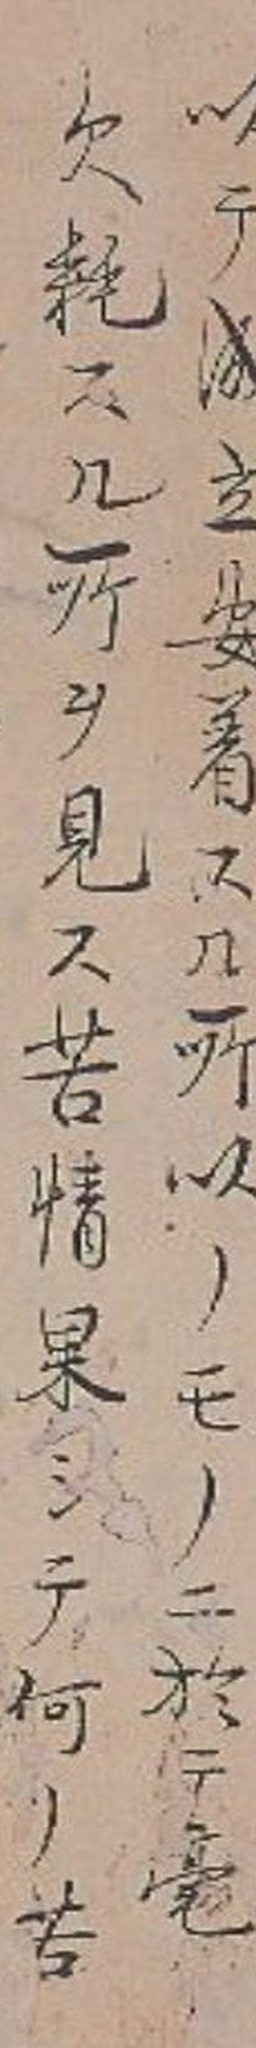欠耗スル所ヲ見ス苦情果シテ何ノ苦
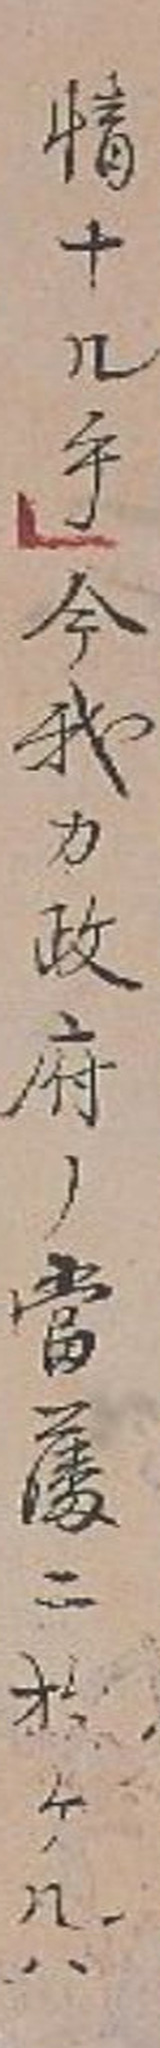情ナル乎」今我カ政府ノ当藩ニ於ケルハ
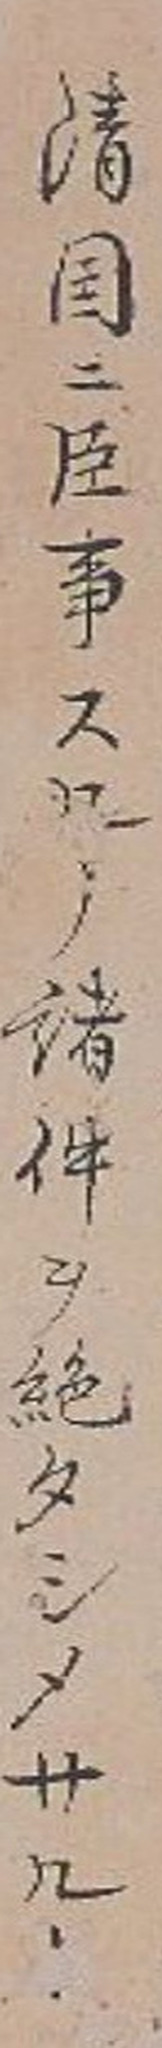清国ニ臣事スルノ諸件ヲ絶タシメサルト
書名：奉使琉球始末 草稿之一部
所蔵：University of the Ryukyus Library
